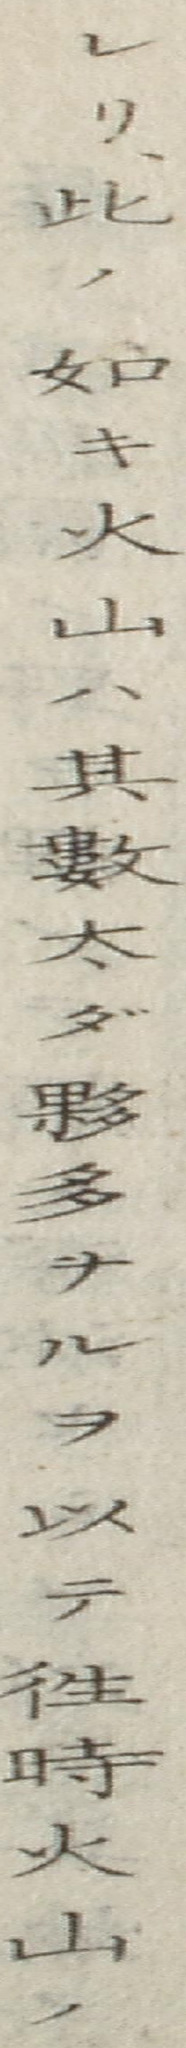レリ、此ノ如キ火山ハ其数太ダ夥多ナルヲ以テ往時火山ノ
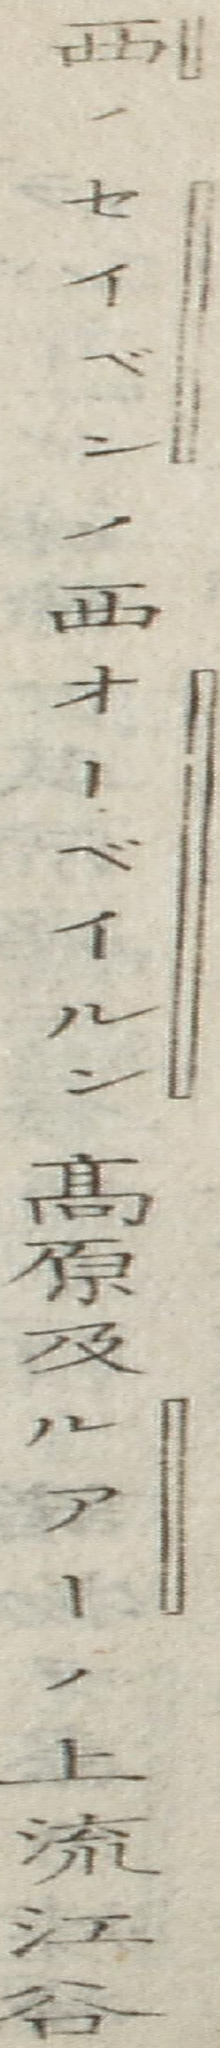西、セイベンノ西オーベイルン高原及ルアーノ上流江谷
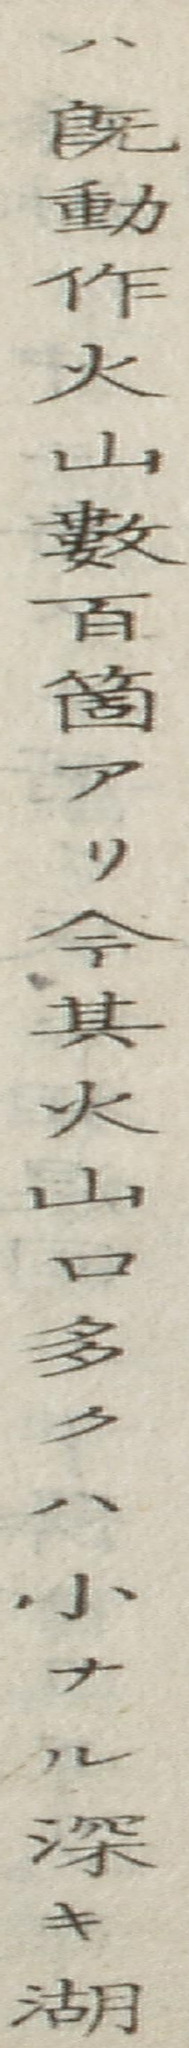ハ既動作火山数百箇アリ今其火山口多クハ小ナル深キ湖
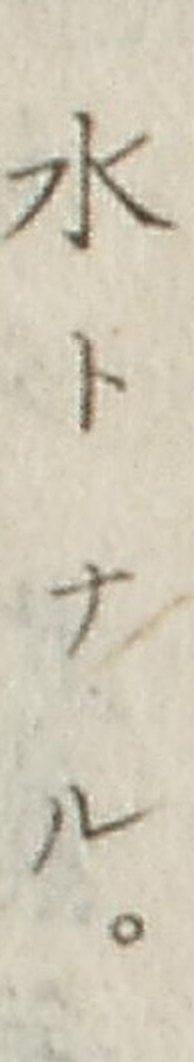水トナル。
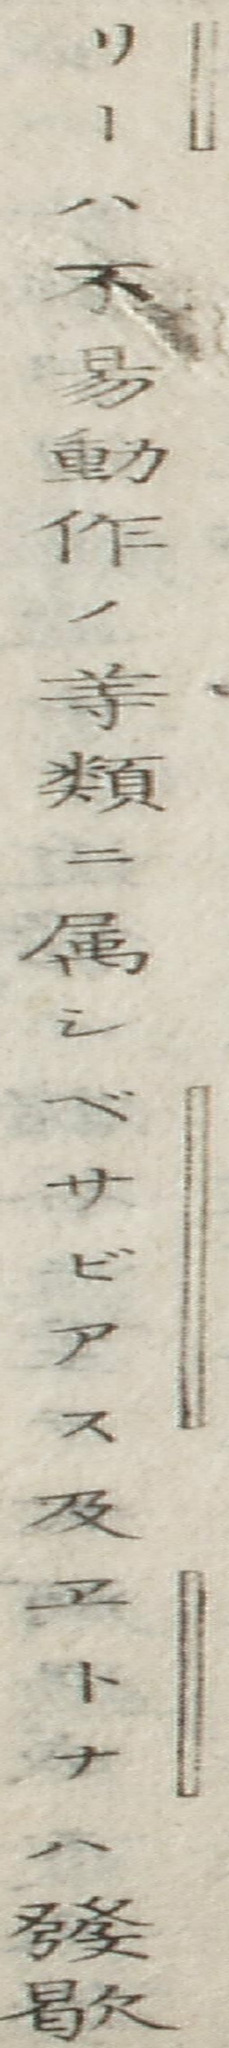リーハ不易動作ノ等類ニ属シベサビアス及ヱトナハ発歇
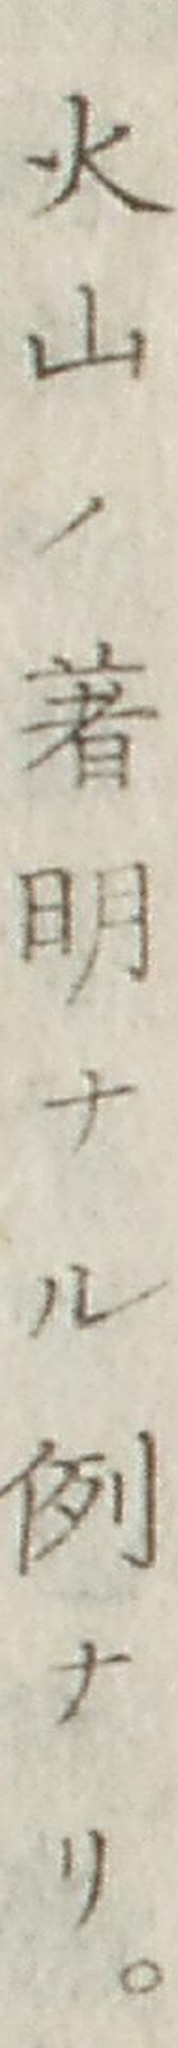火山ノ著名ナル例ナリ。
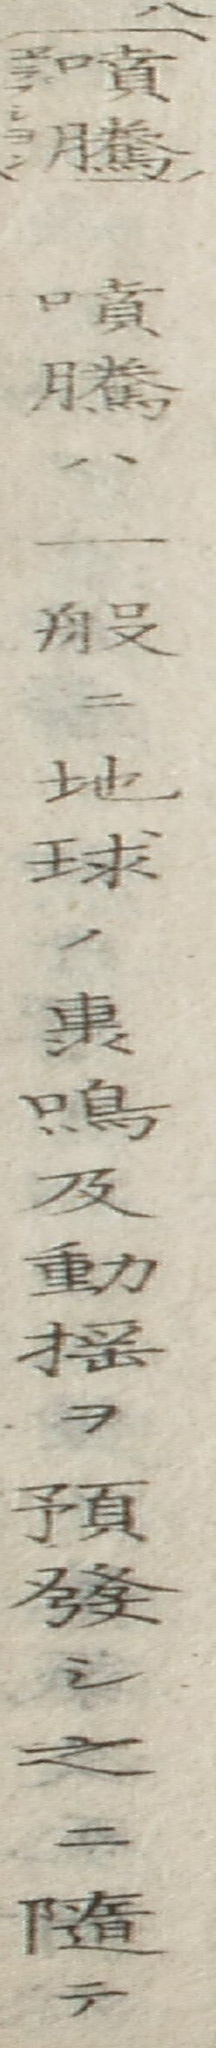八[噴騰]噴騰ハ地球ノ轟鳴及動揺ヲ預発シ之ニ随テ

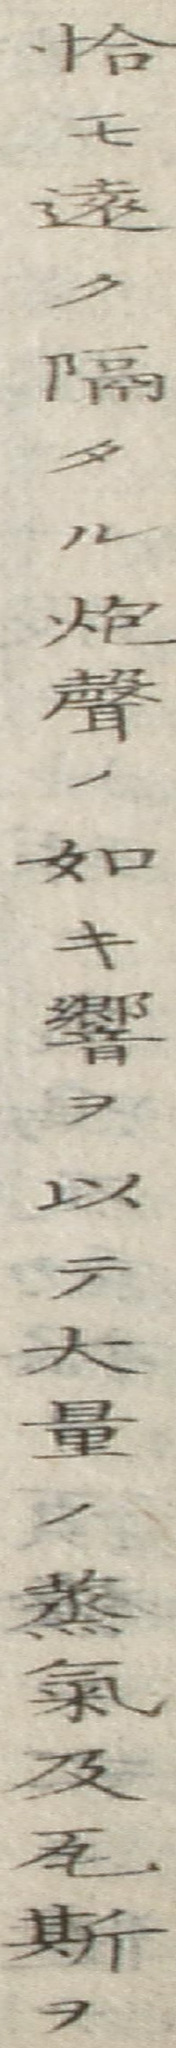恰モ遠ク隔タル炮声ノ如キ響ヲ以テ大量ノ蒸気及瓦斯ヲ
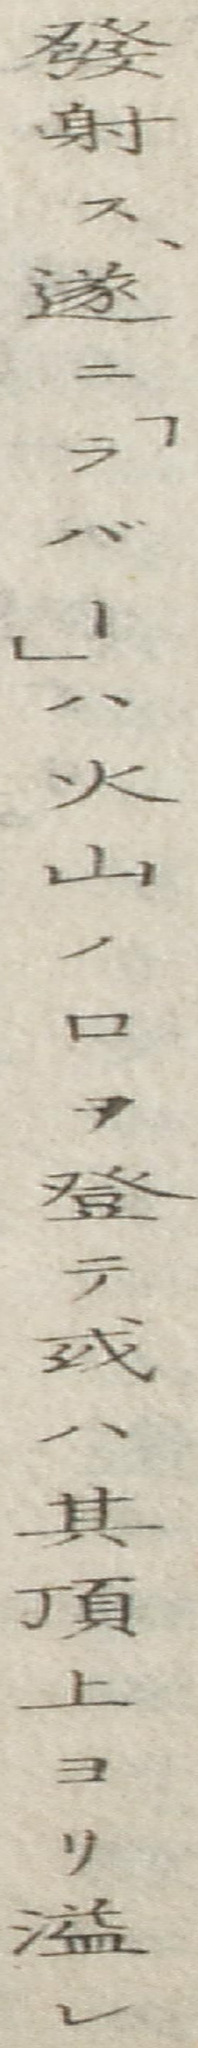発射ス、遂ニ「ラバー」ハ火山ノ口ヲ登テ或ハ其頂上ヨリ溢レ
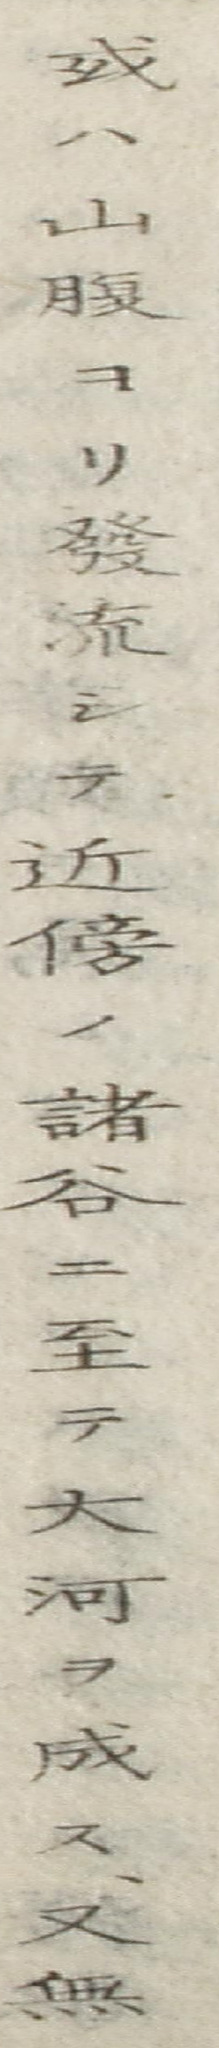或ハ山腹ヨリ発流シテ近傍ノ諸谷ニ至テ大河ヲ成ス、又無
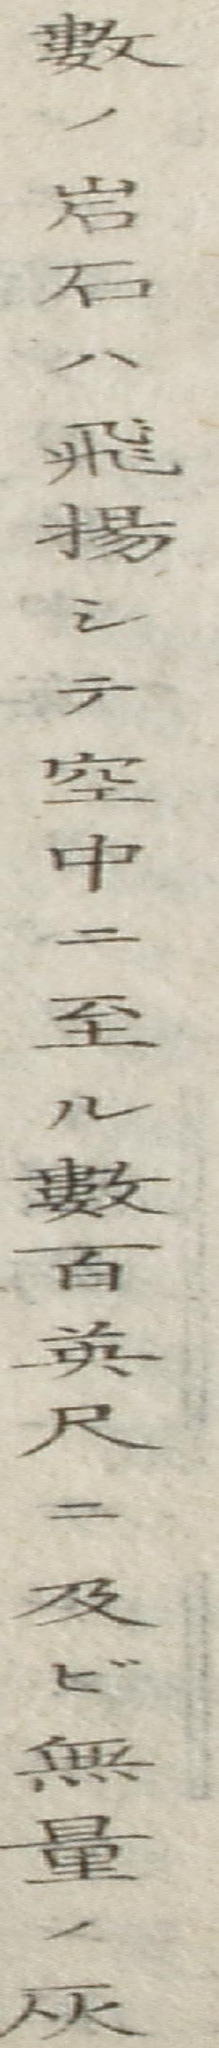数ノ岩石ハ飛揚シテ空中ニ至ル数百英尺ニ及ビ無量ノ灰
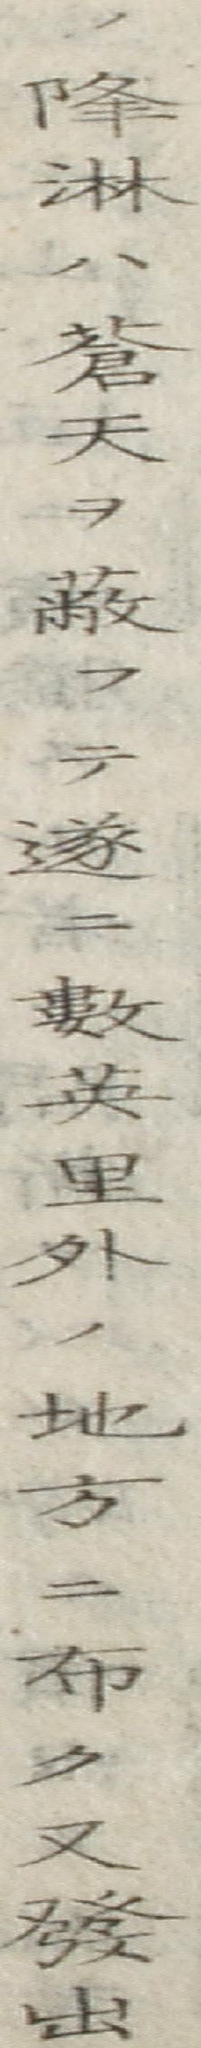ノ降淋ハ蒼天ヲ蔽フテ遂ニ数英里外ノ地方ニ布ク又発出
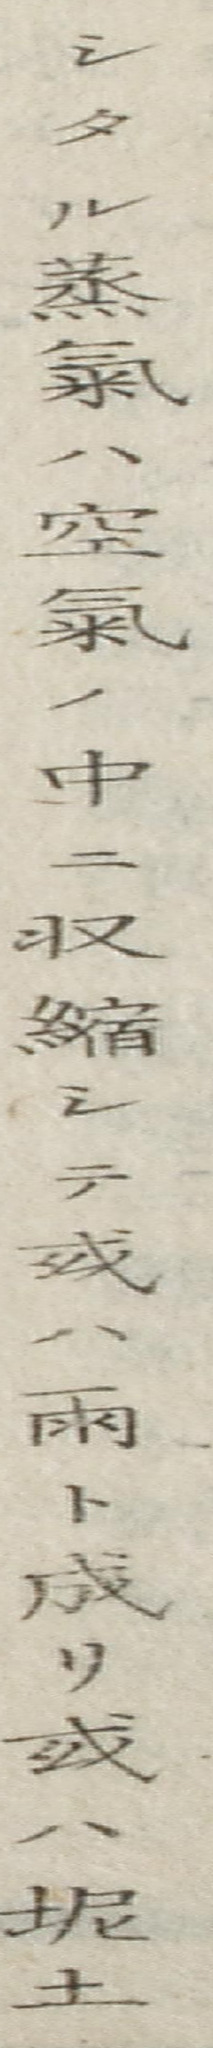シタル蒸気ハ空気ノ中ニ収縮シテ或ハ雨ト成リ或ハ泥土
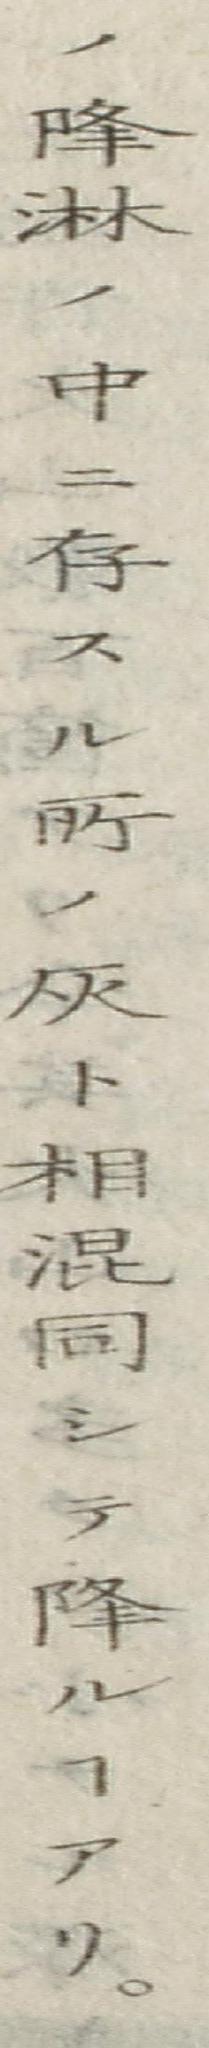ノ降淋ノ中ニ存スル所ノ灰ト相混同シテ降ルヿアリ。
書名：地形論　巻二
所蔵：東京大学地震研究所図書室 Earthquake Research Institute Library, The University of Tokyo, JAPAN
